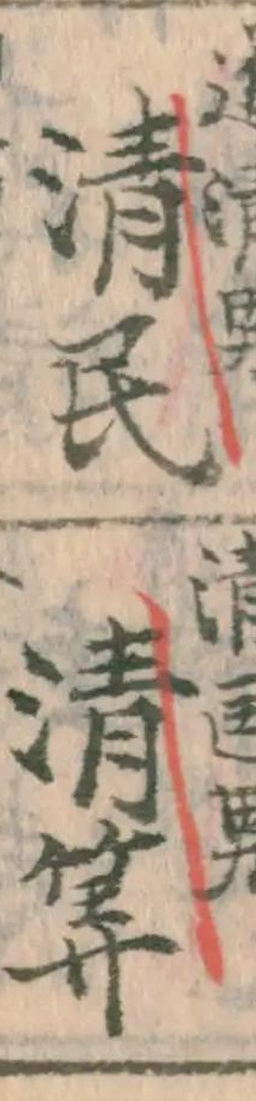清民清等
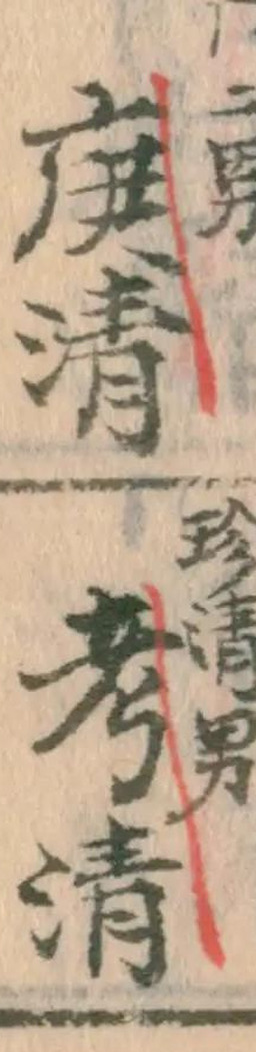庚清考清

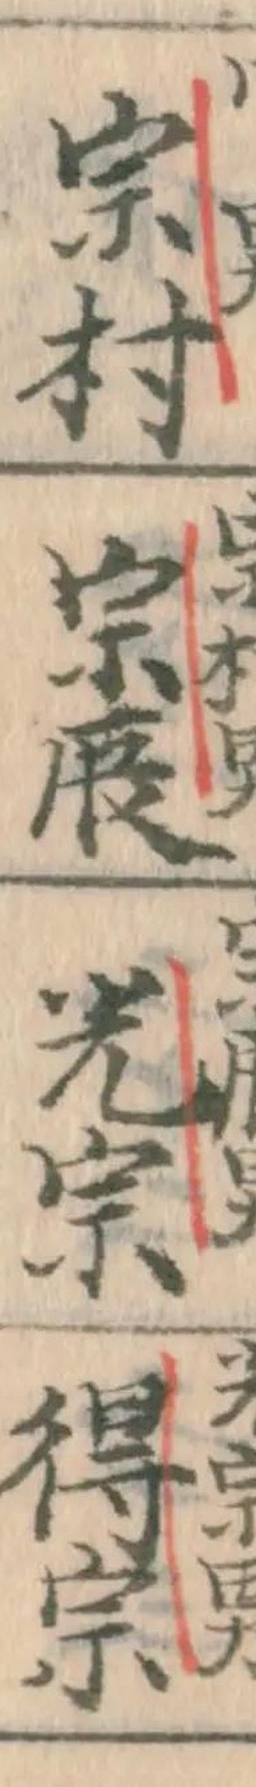宗村宗辰光宗得宗
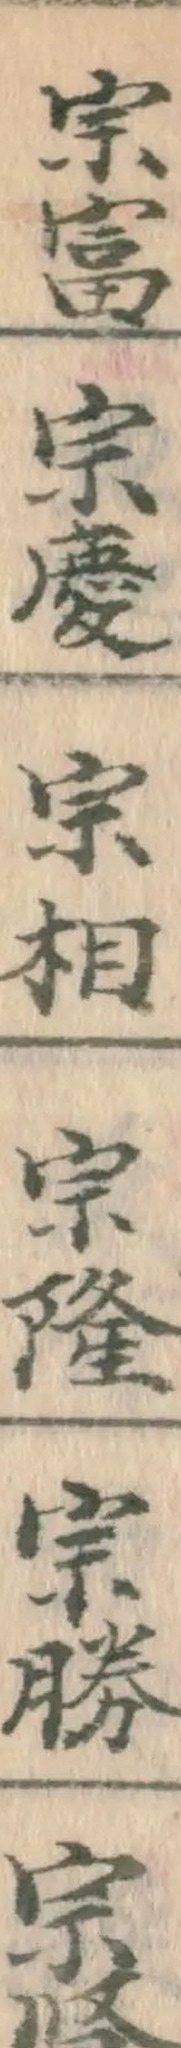宗富宗慶宗相宗隆宗勝宗賢
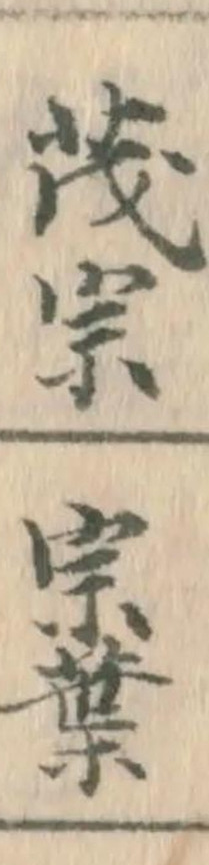茂宗宗葉

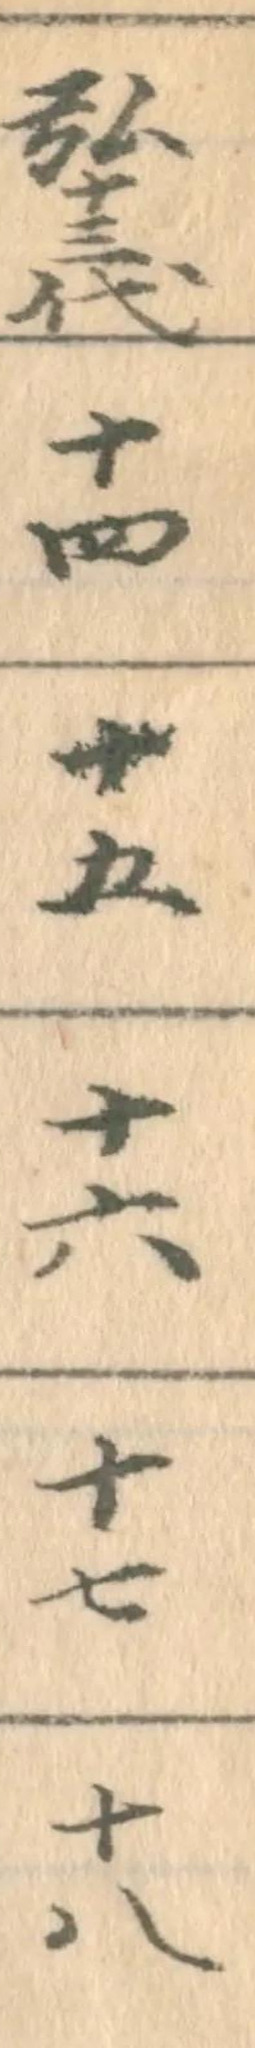弘十三代十四十五十六十七十八
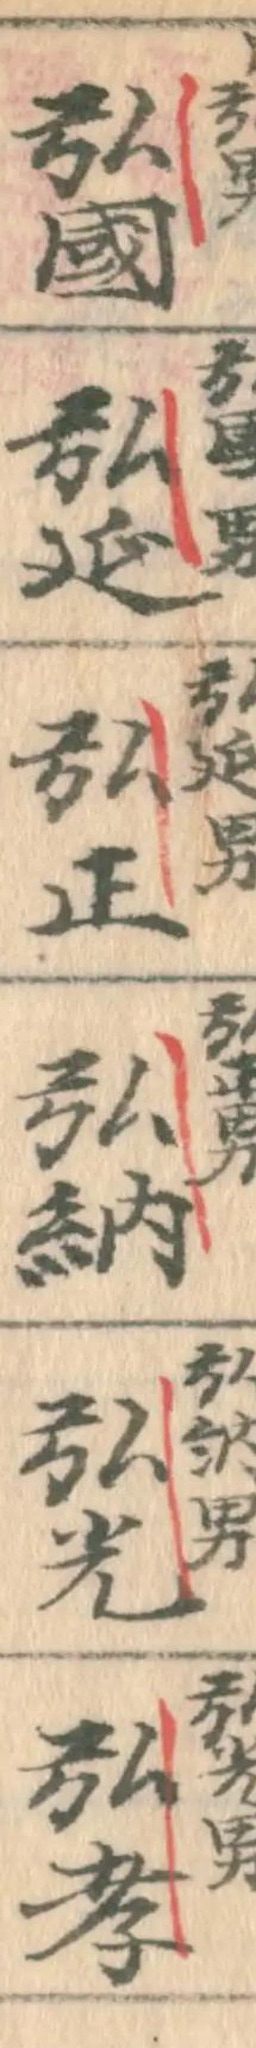弘国弘延弘正弘納弘光弘孝
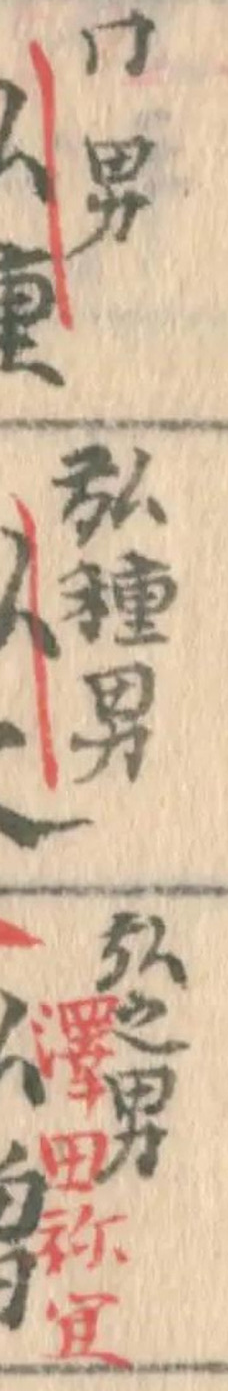同男弘種男弘之男
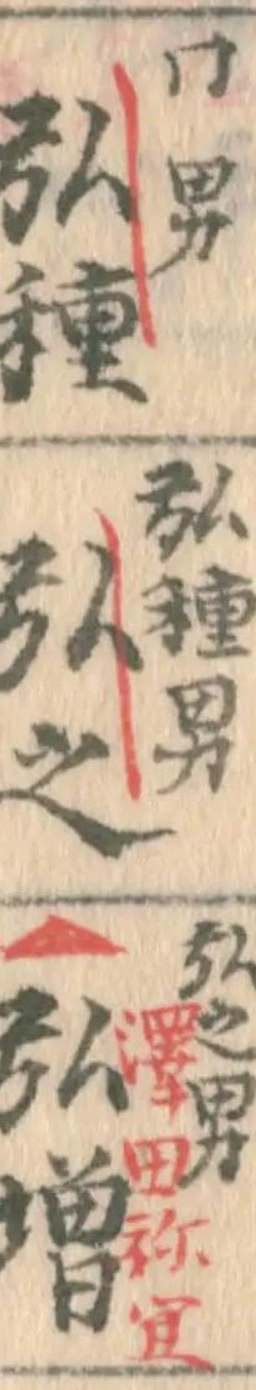弘種弘之▲弘増
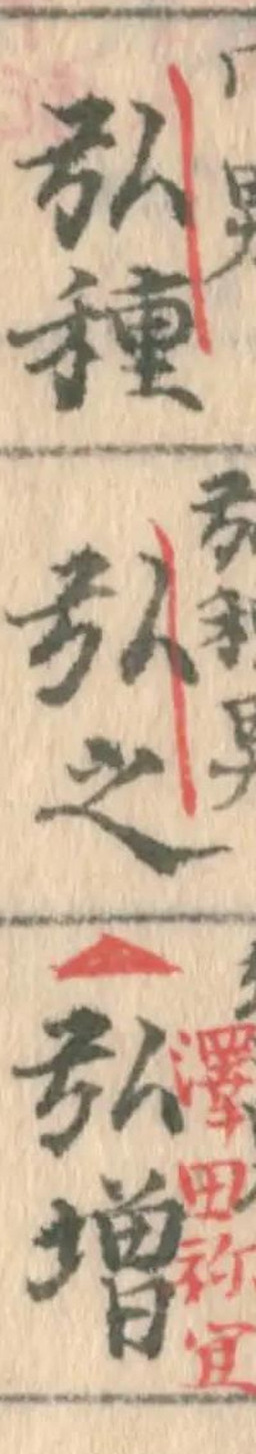弘種弘之▲弘増
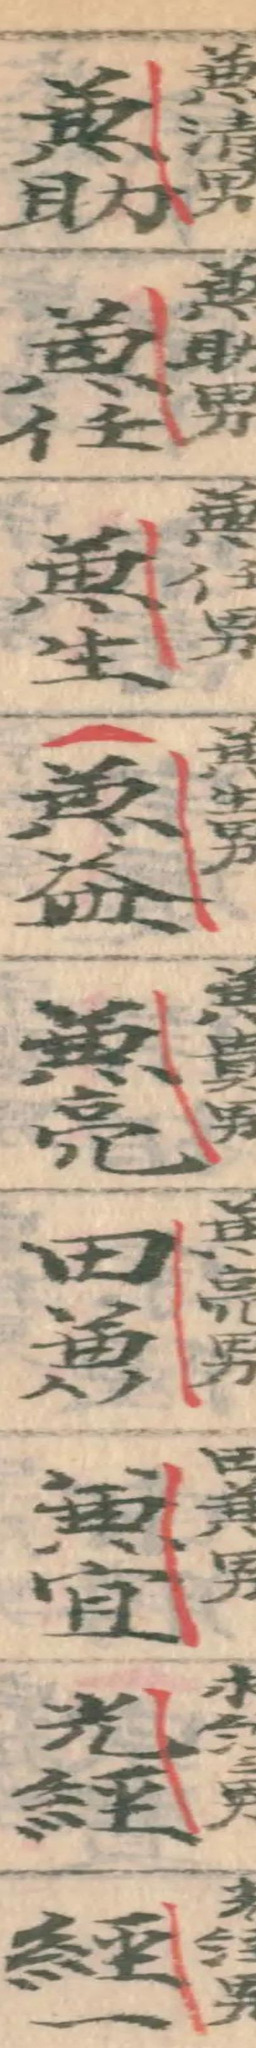兼助兼任兼生▲兼益兼亮田兼兼宜光経経一
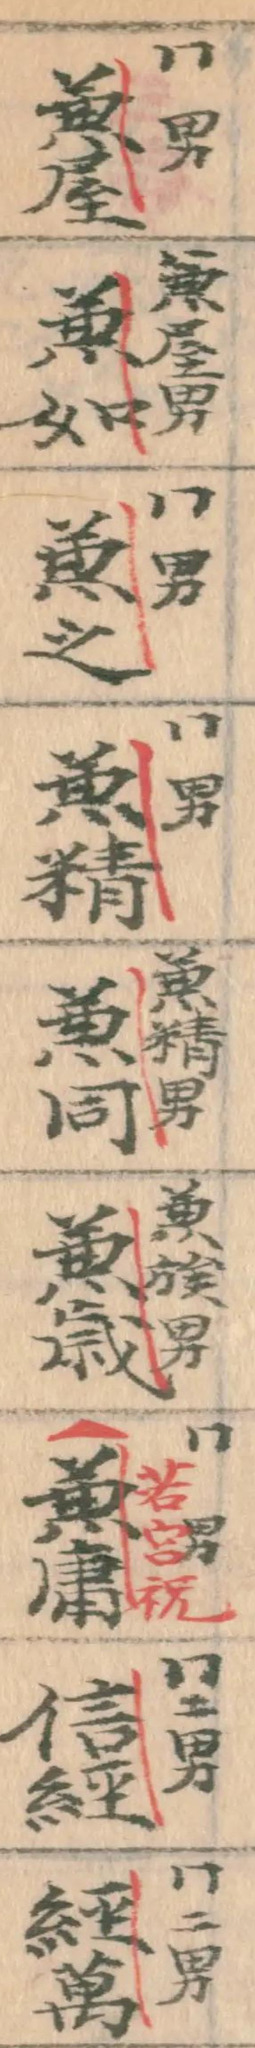兼屋兼如兼之兼精兼同兼歳▲兼庸信経経万
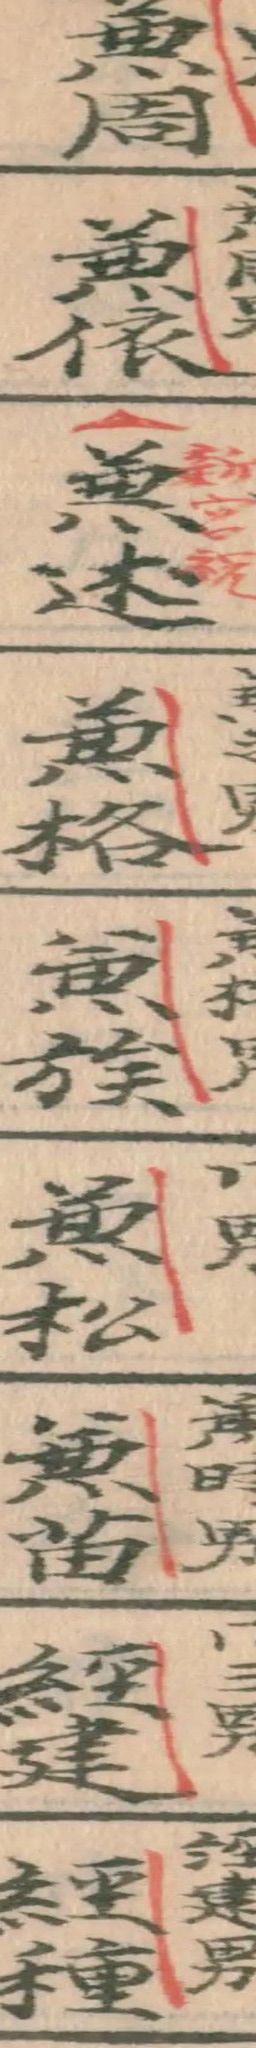兼周兼依▲兼述兼格兼族兼松経苗経建経種
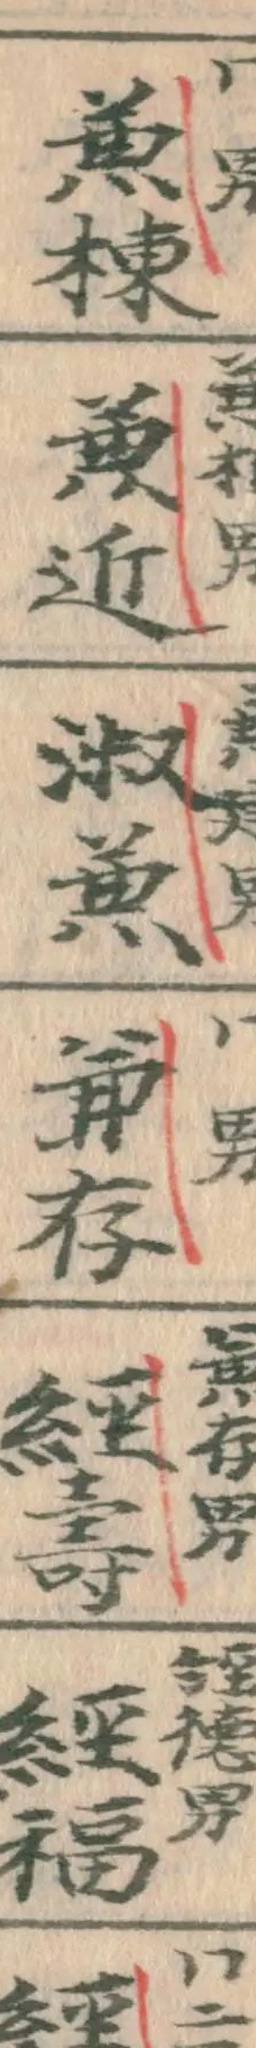兼棟兼近淑兼兼存経寿経福経猶

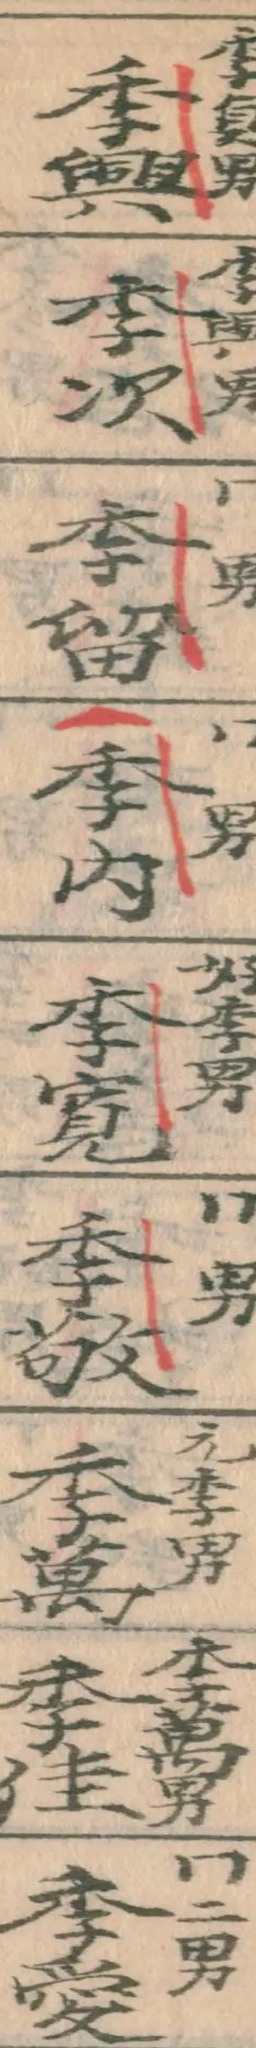季興季次季留▲季内季寛季敬季万季佳季愛
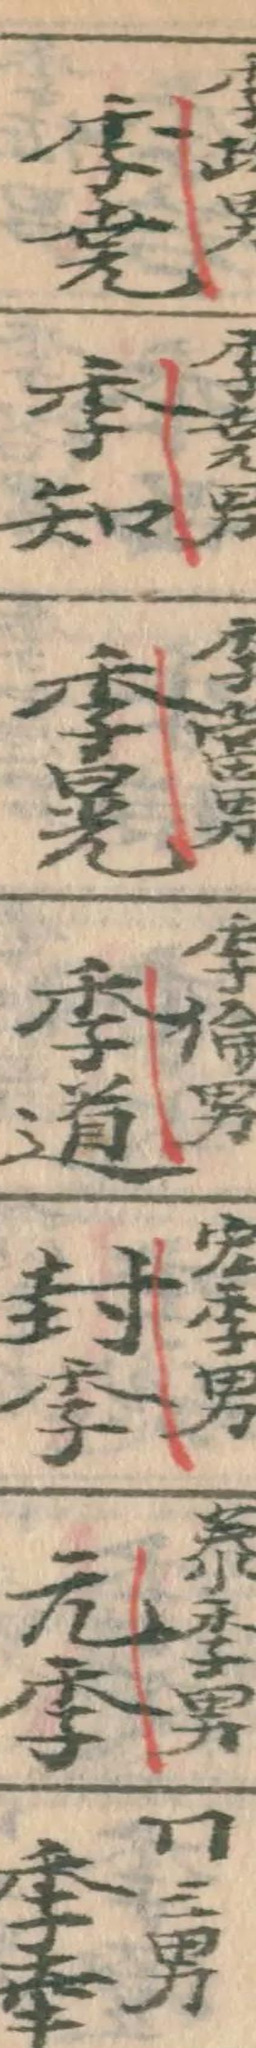季尭季知季晃季道封季元季季幸季虎
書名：賀茂社記録. 第24冊
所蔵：国立国会図書館 National Diet Library, JAPAN
